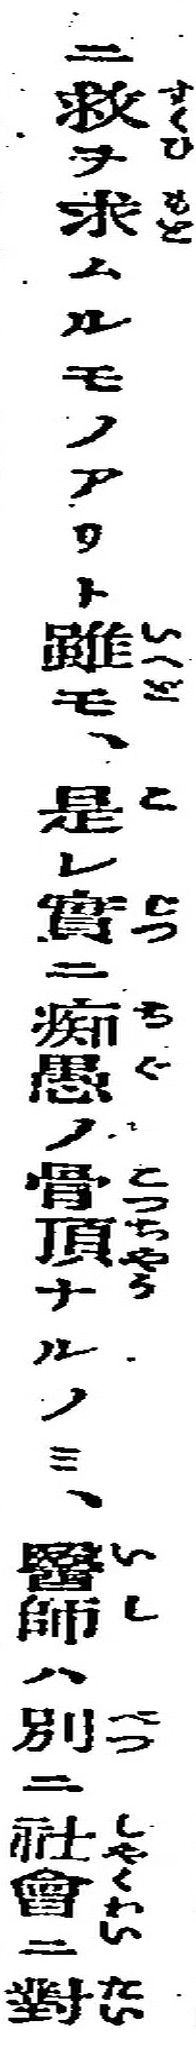ニ救ヲ求ムルモノアリト雖モ、是レ実ニ痴愚ノ骨頂ナルノミ、医師ハ別ニ社会ニ対
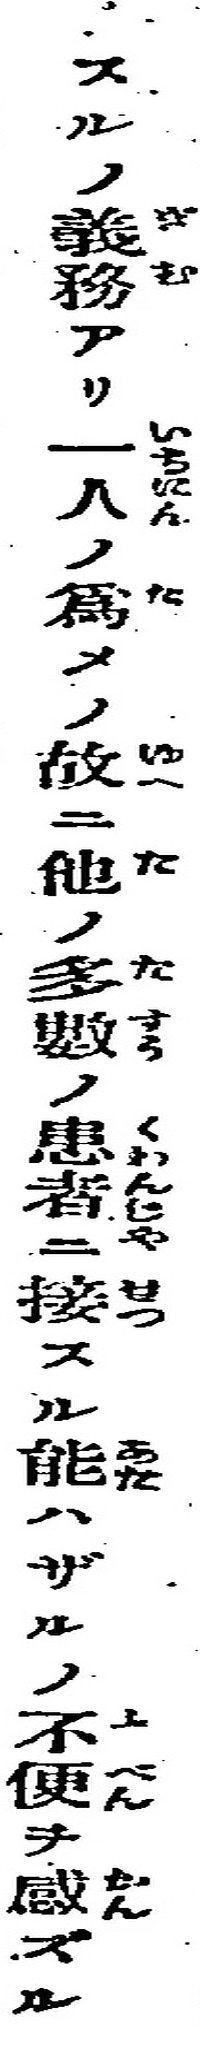スルノ義務アリ一人ノ為メノ故ニ他ノ多数ノ患者ニ接スル能ハザルノ不便ヲ感ズル
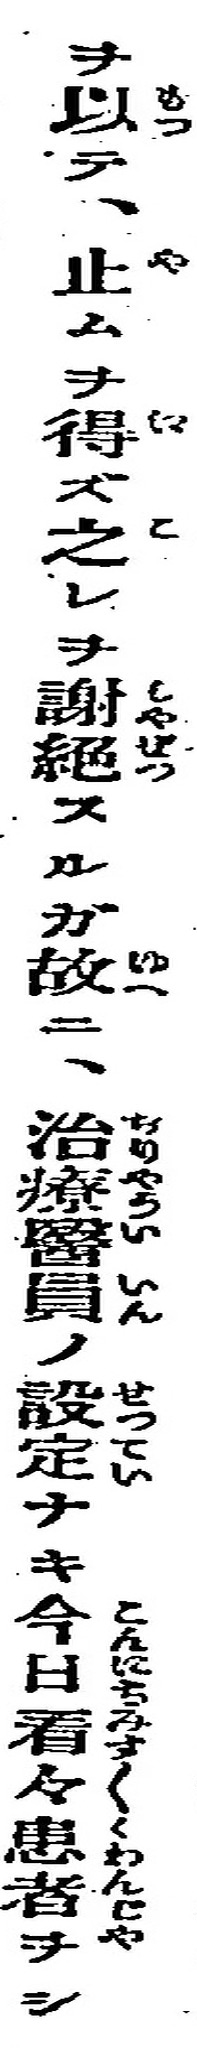ヲ以テ、止ムヲ得ズ之レヲ謝絶スルガ故ニ、治療医員ノ設定ナキ今日看々患者ヲシ
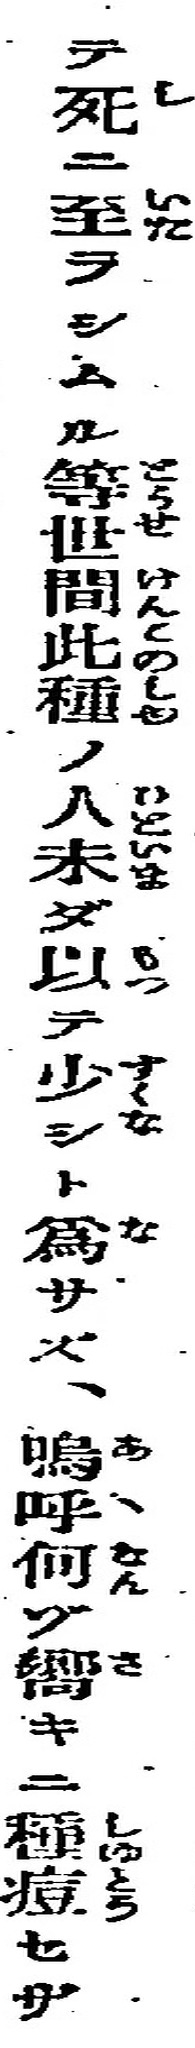テ死ニ至ラシムル等世間此種ノ人未ダ以テ少シト為サズ、嗚呼何ゾ嚮キニ種痘セザ
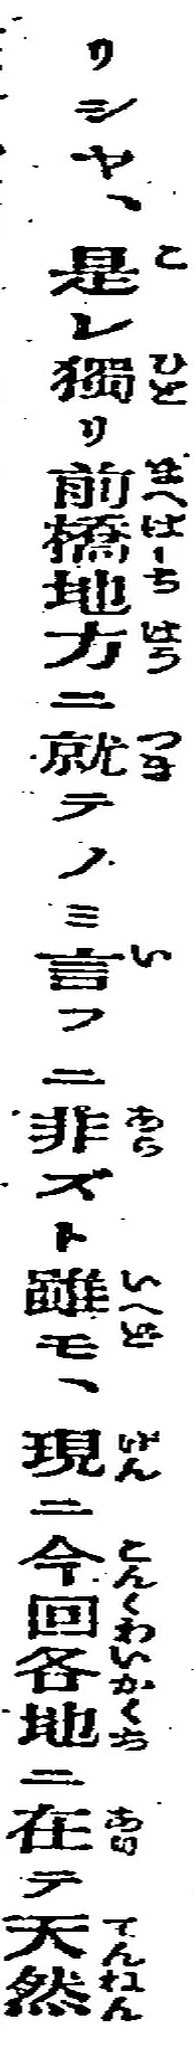リシヤ、是レ独リ前橋地方ニ就テノミ言フニ非ズト雖モ、現ニ今回各地ニ在テ天然
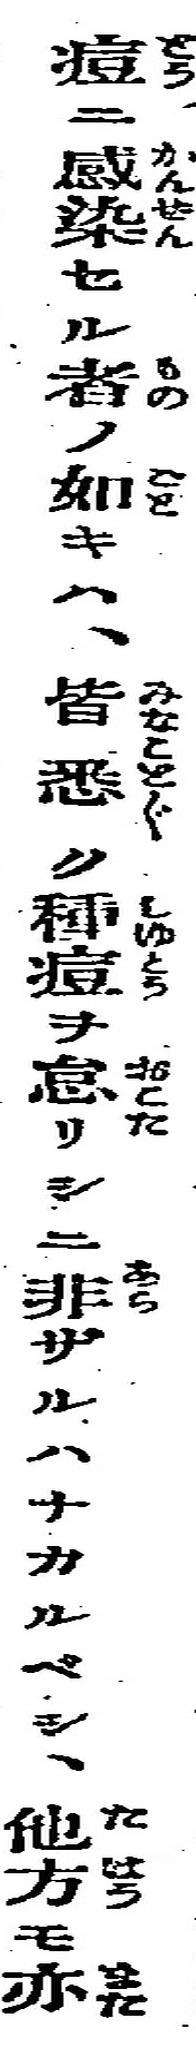痘ニ感染セル者ノ如キハ、皆悉ク種痘ヲ怠リシニ非ザルハナカルベシ、他方モ亦
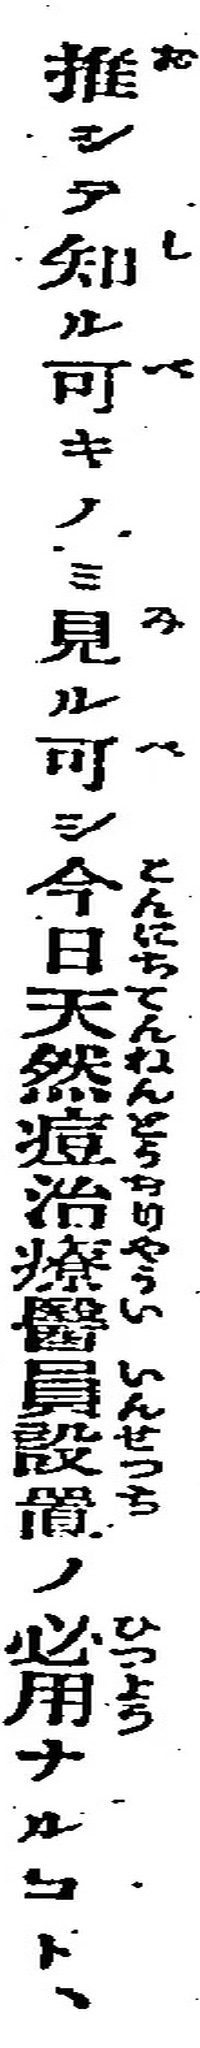推シテ知ル可キノミ見ル可シ今日天然痘治療医員設置ノ必用ナルコト、
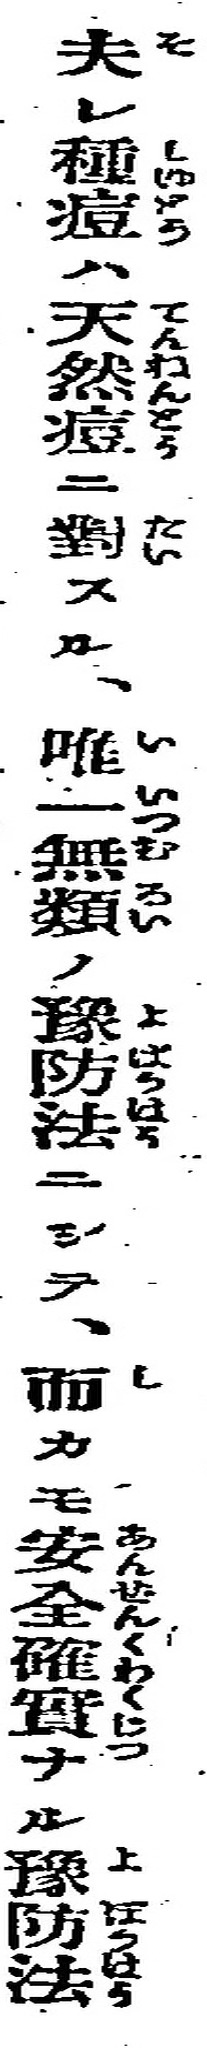夫レ種痘ハ天然痘ニ対スル、唯一無類ノ予防法ニシテ、而カモ安全確実ナル予防法
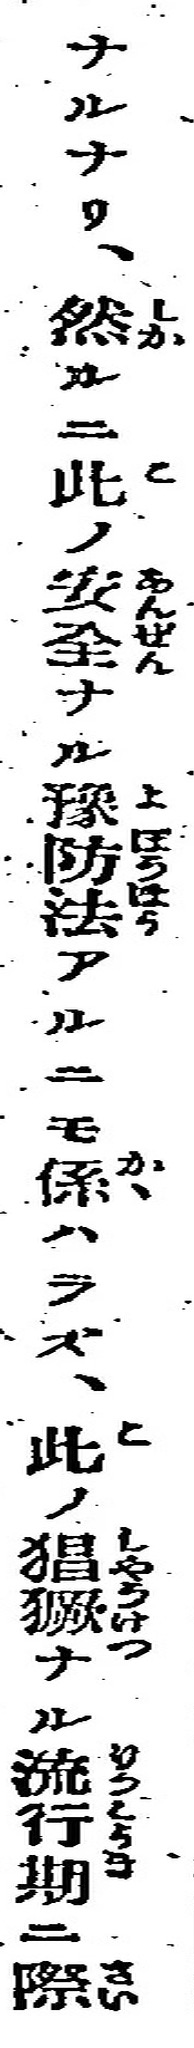ナルナリ、然ルニ此ノ安全ナル予防法アルニモ係ハラズ、此ノ猖獗ナル流行期ニ際

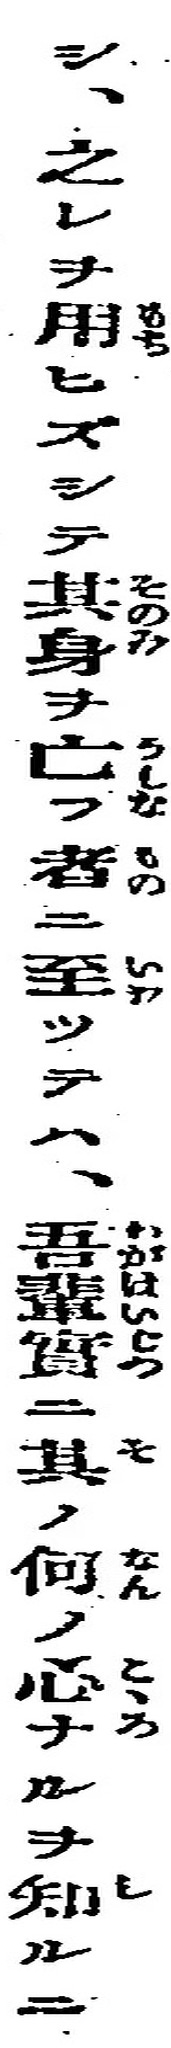シ、之レヲ用ヒズシテ其身ヲ亡フ者ニ至ツテハ、吾輩実ニ其ノ何ノ心ナルヲ知ルニ
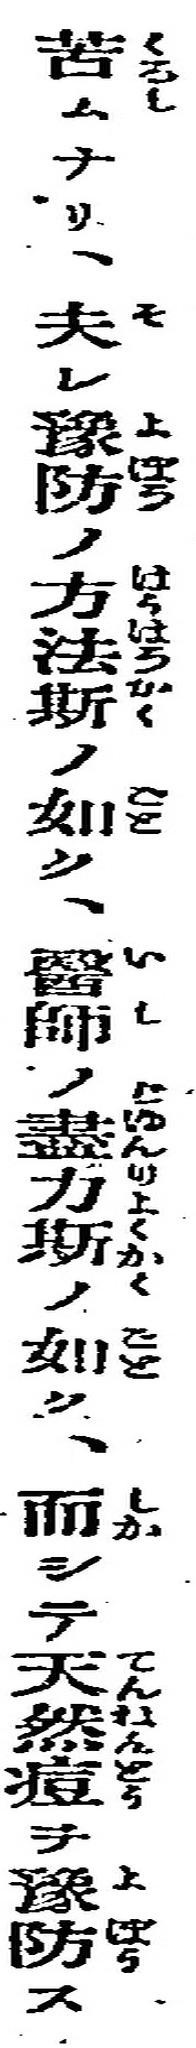苦ムナリ、夫レ予防ノ方法斯ノ如ク、医師ノ尽力斯ノ如ク、而シテ天然痘ヲ予防ス
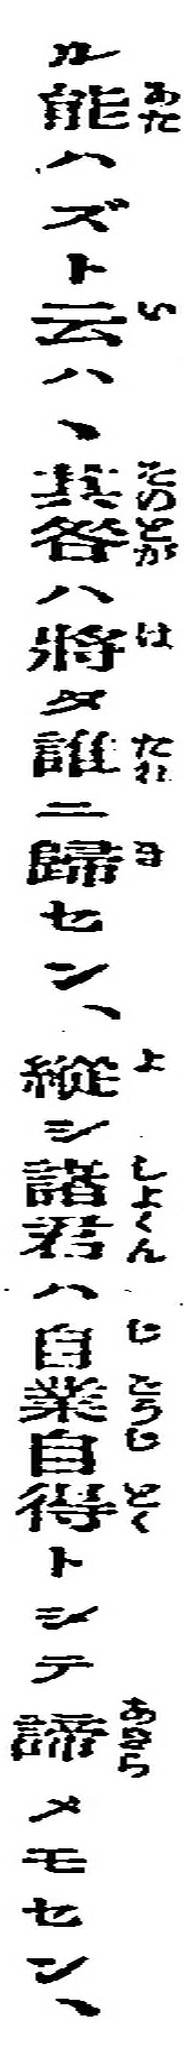ル能ハズト云ハゝ其咎ハ将タ誰ニ帰セン、縱シ諸君ハ自業自得トシテ諦メモセン、
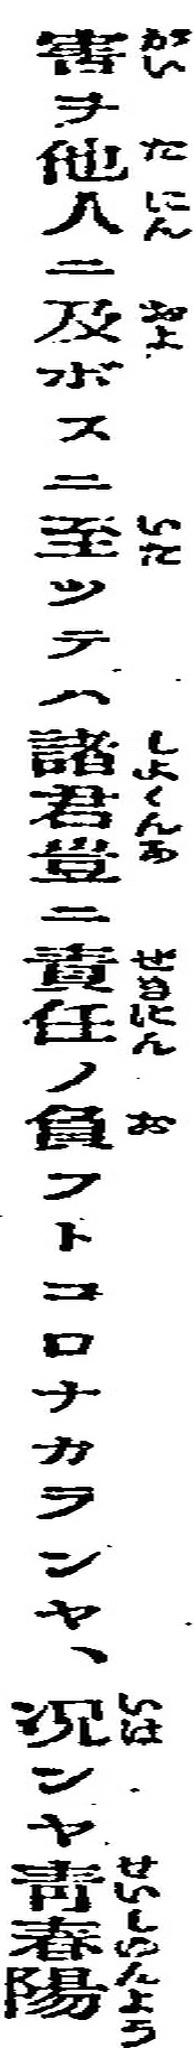害ヲ他人ニ及ボスニ至ツテハ諸君豈ニ責任ノ負フトコロナカランヤ、況ンヤ青春陽
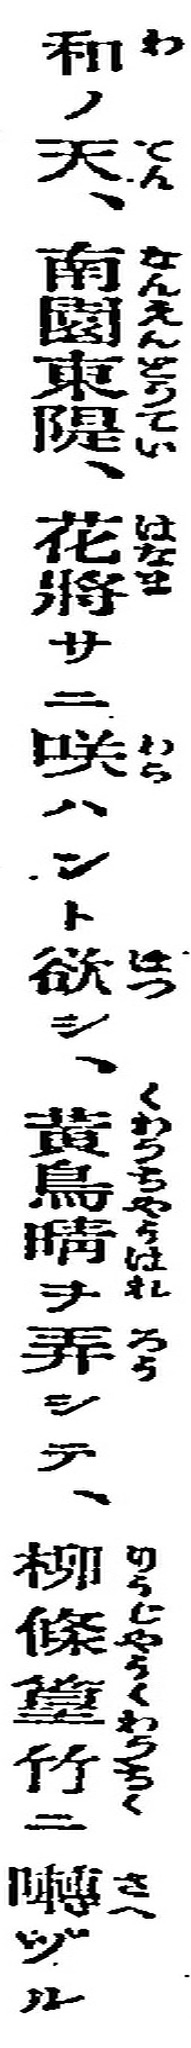和ノ天、南園東隄、花将サニ咲ハント欲シ、黄鳥晴ヲ弄シテ、柳条篁竹ニ囀ヅル
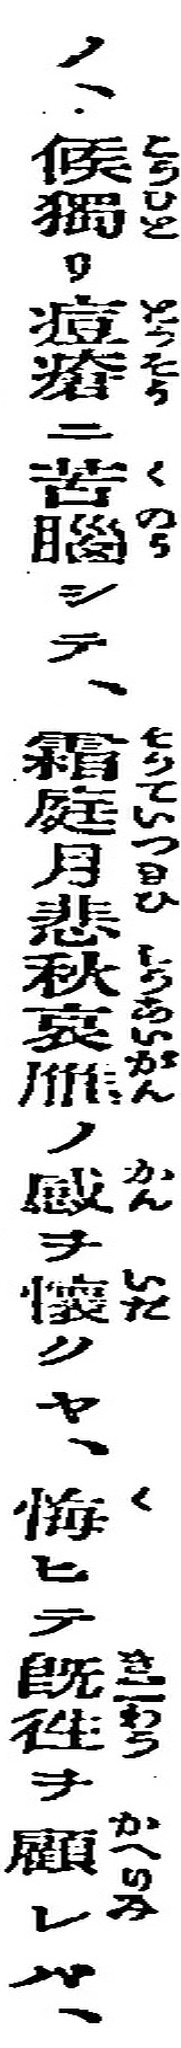ノ、候独リ痘瘡ニ苦悩シテ、霜庭月悲秋哀雁ノ感ヲ懐クヤ、悔ヒテ既往ヲ顧レバ、
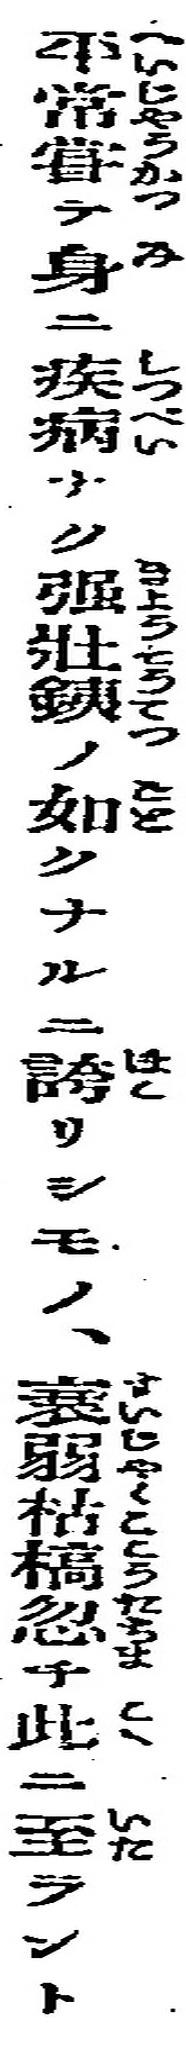平常甞テ身ニ疾病ナク強壮鉄ノ如クナルニ誇リシモノ、衰弱枯槁忽チ此ニ至ラント
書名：天然痘予防注意兼種痘者之注意
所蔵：国立国会図書館 National Diet Library, JAPAN
